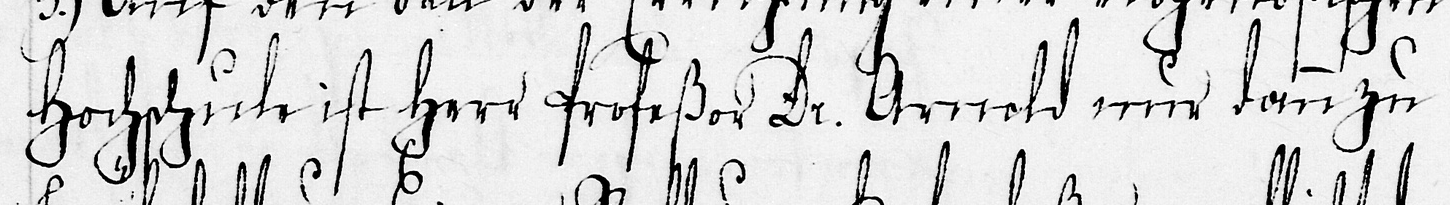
Hochschule ist Herr Profeßor Dr. Arnold nur dann zu
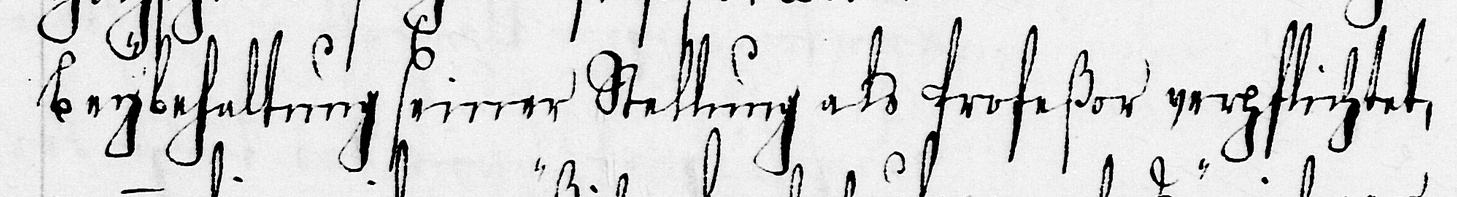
Beybehaltung seiner Stellung als Profeßor verpflichtet,
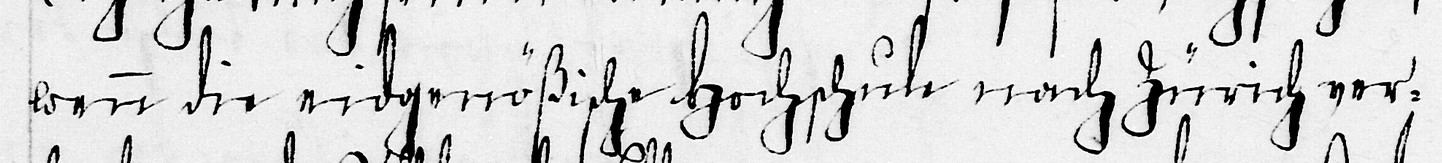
wenn die eidgenößische Hochschule nach Zürich ver¬
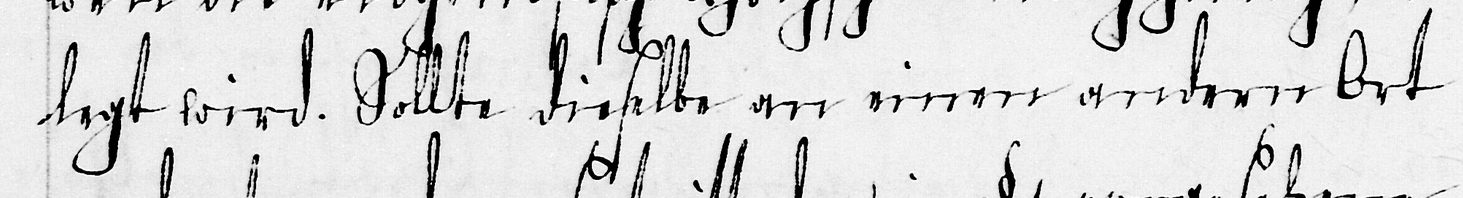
legt wird. Sollte dieselbe an einen andern Ort
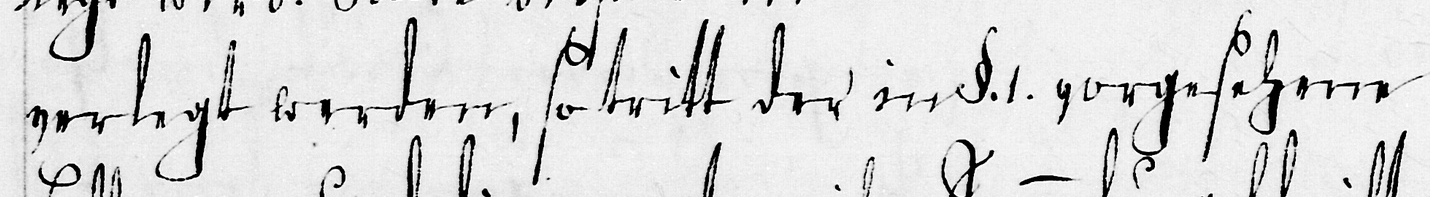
verlegt werden, so tritt der in §. 1. vorgesehene
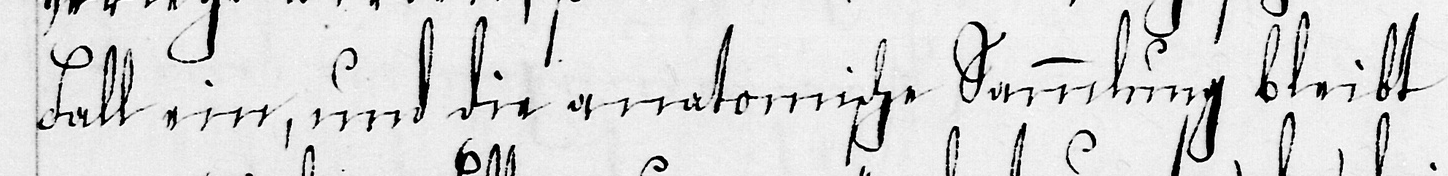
Fall ein, und die anatomische Sammlung bleibt
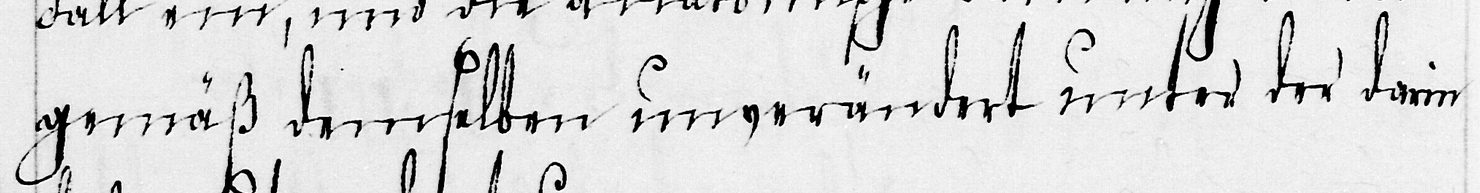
gemäß demselben unverändert unter der darin
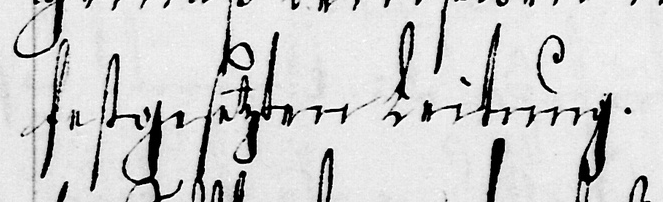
festgesetzten Leitung.
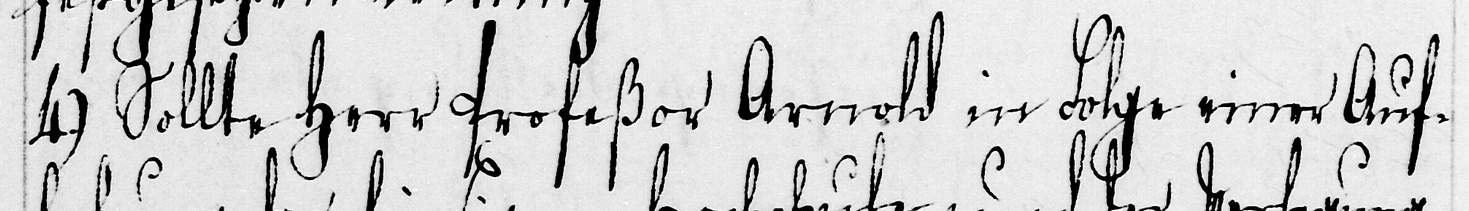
4.) Sollte Herr Profeßor Arnold in Folge einer Auf¬
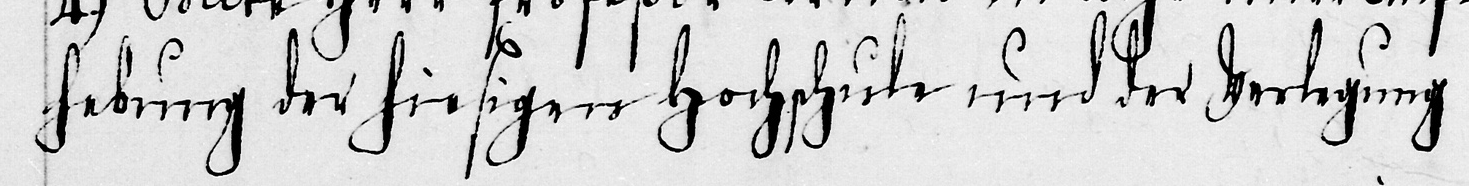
hebung der hiesigen Hochschule und der Verlegung
